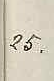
25.
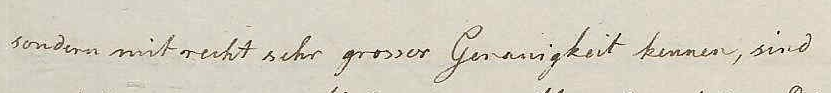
sondern mit recht sehr grosser Genauigkeit kennen, sind
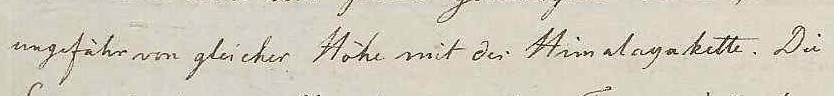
ungefähr von gleicher Höhe mit der Himalayakette. Die
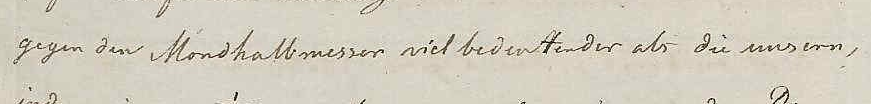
gegen den Mondhalbmesser viel bedeutender als die unsern,
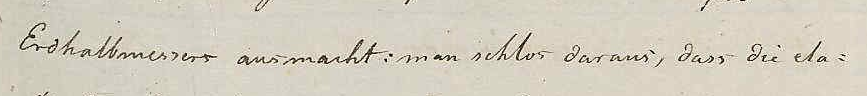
Erdhalbmessers ausmacht: man schlos daraus, dass die ela-
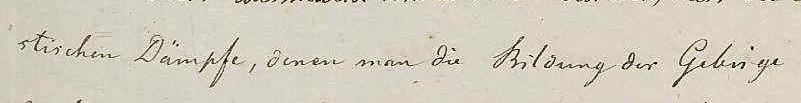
stischen Dämpfe, denen man die Bildung der Gebirge
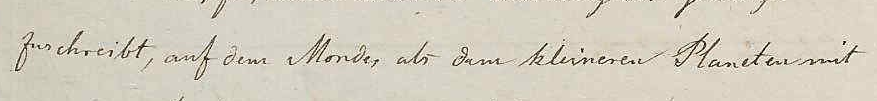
zuschreibt, auf dem Monde, als dem kleineren Planeten mit
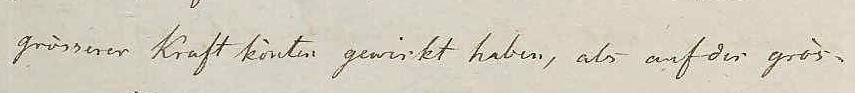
grösserer Kraft könten gewirkt haben, als auf der grös-
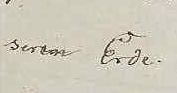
seren Erde.
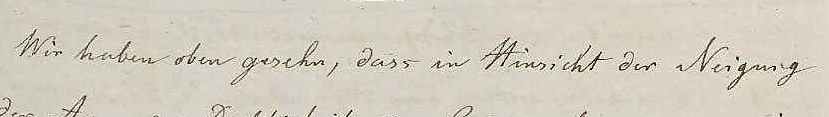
Wir haben oben gesehn, dass in Hinsicht der Neigung
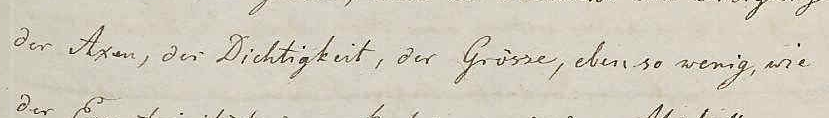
der Axen, der Dichtigkeit, der Grösse, ebenso wenig, wie
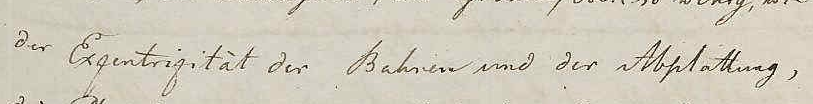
der Exzentrizität der Bahnen und der Abplattung,
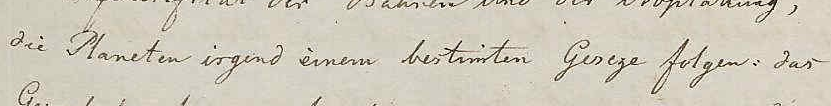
die Planeten irgend einem bestimten Geseze folgen: das
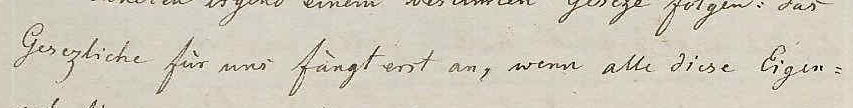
Gesezliche für uns fängt erst an, wenn alle diese Eigen-
